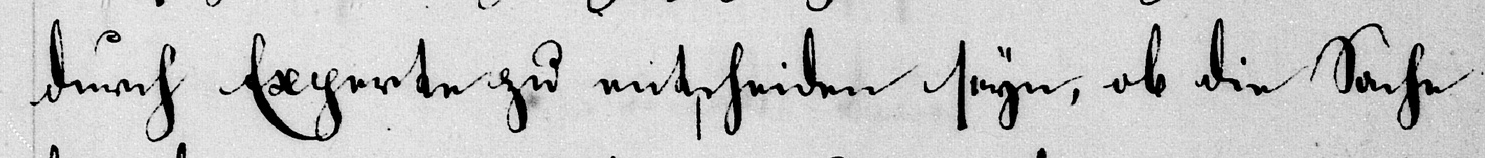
durch Experten zu entscheiden seyn, ob die Sache
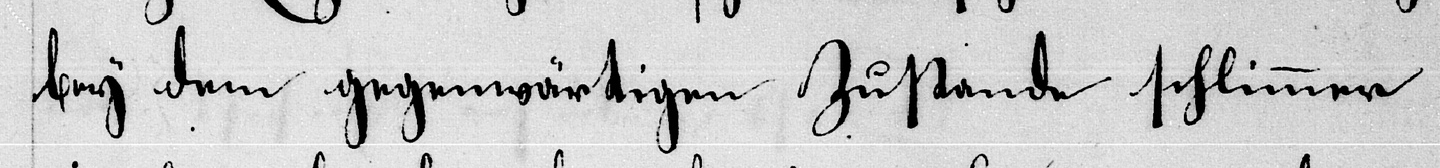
bey dem gegenwärtigen Zustande schlimmer
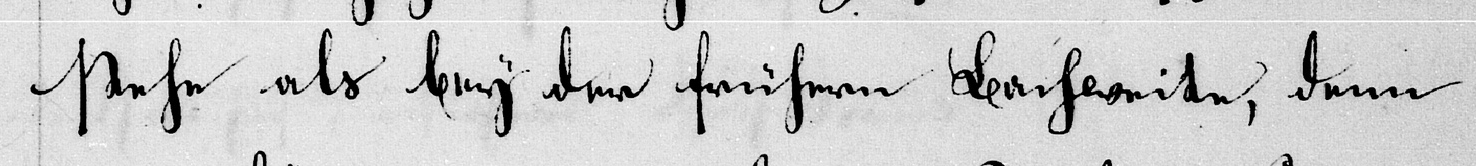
stehe als bey der frühern Bachweite, denn
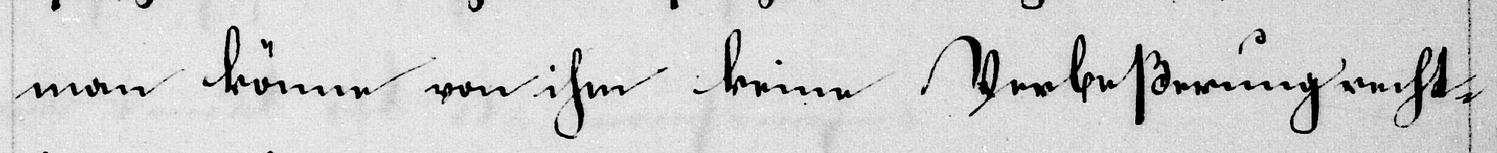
man könne von ihm keine Verbeßerung recht¬
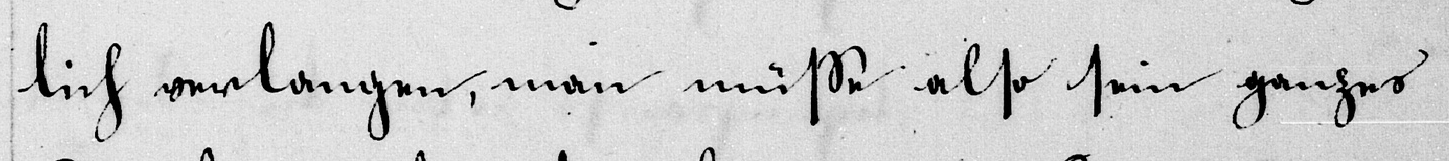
lich verlangen, man müße also sein ganzes
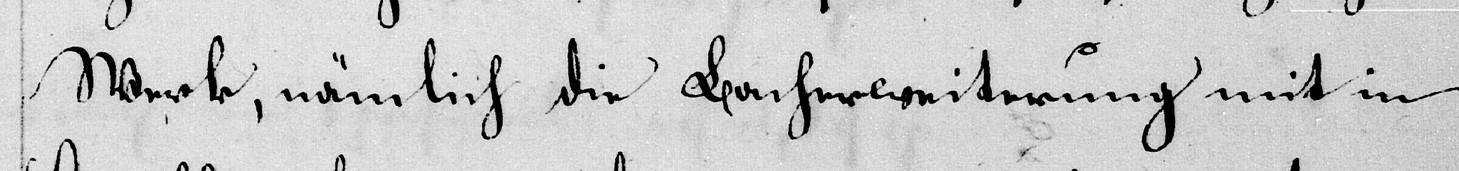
Werk, nämlich die Bacherweiterung mit in
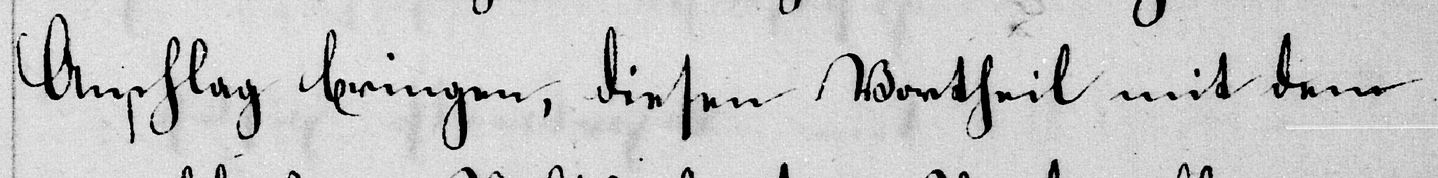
Anschlag bringen, diesen Vortheil mit dem
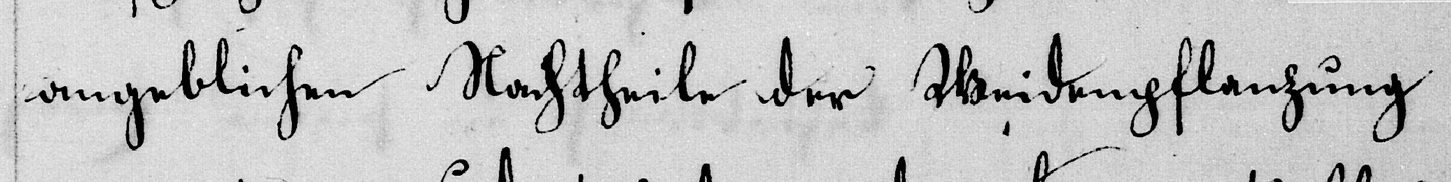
angeblichen Nachtheile der Weidenpflanzung
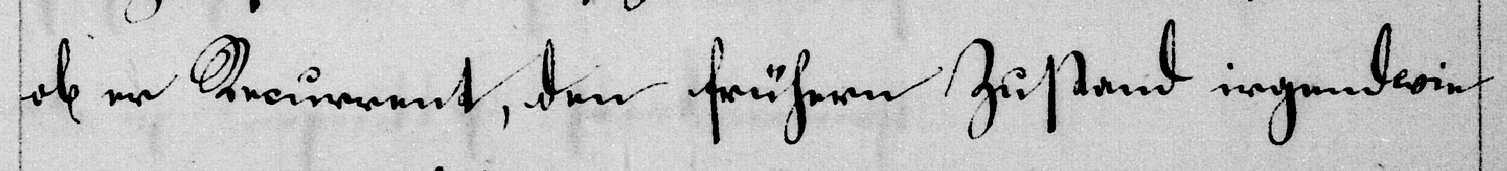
ob er Recurrent, den frühern Zustand irgendwie
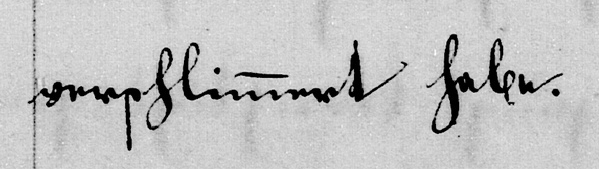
verschlimmert habe.
